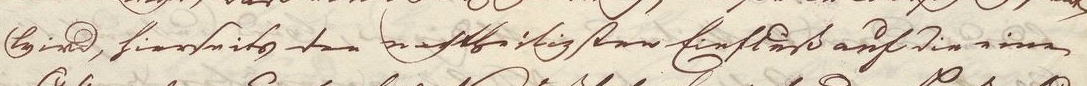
wird, hierseits den nachtheiligsten Einfluß auf die eine
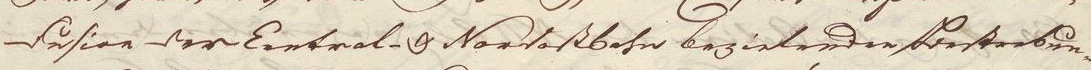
Fusion der Central- & Nordostbahn bezielenden Bestrebun-
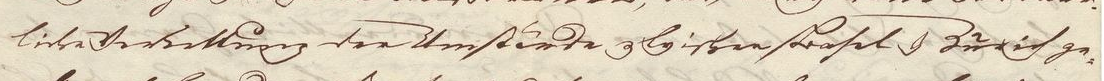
liche Verkettung der Umstände zwischen Basel & Zürich ge-
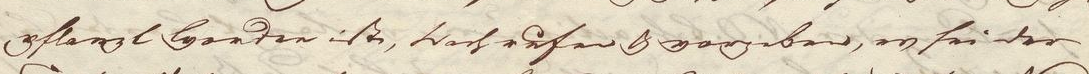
pflanzt worden ist, wachrufen & vorgeben, es sei der
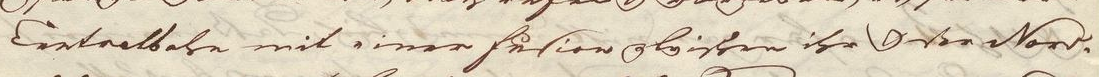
Centralbahn mit einer Fusion zwischen ihr & der Nord-
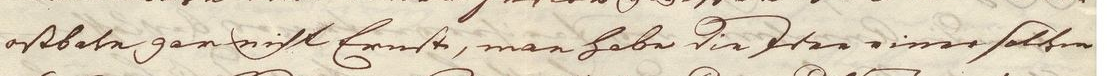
ostbahn gar nicht Ernst, man habe die Idee einer solchen
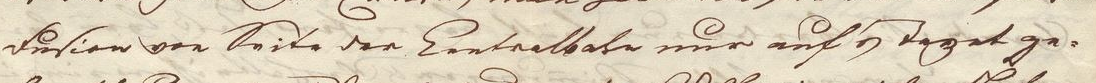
Fusion von Seite der Centralbahn nur auf's Tapet ge-
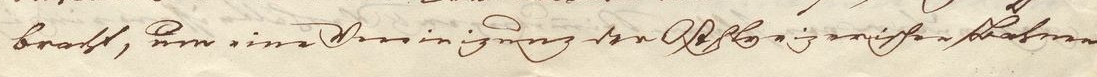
bracht, um eine Vereinigung der Ostschweizerischen Bahnen
